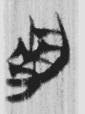{來力}
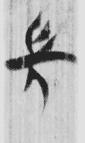𡵂
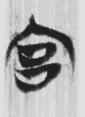宮
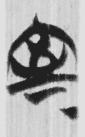室
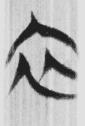衣
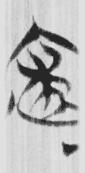裘
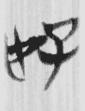好
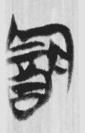酓
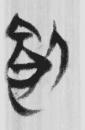飤
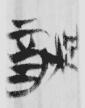{酉枳}
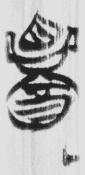釀
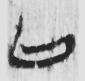㠯（以）
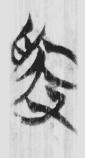爰
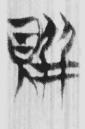{貝并}
